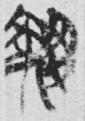○（勢）
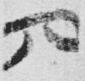亓（其）
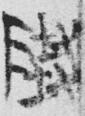隓（墮）
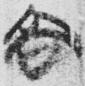吝
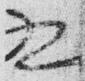九
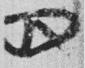四
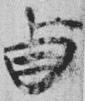貞
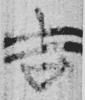吉
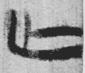亡
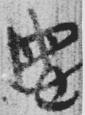悔
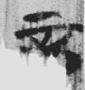僮（憧）
